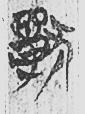{單犬}
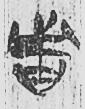周
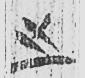之
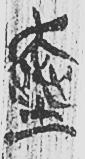{奔土}
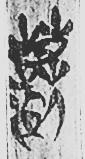{莫死}
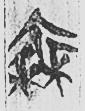秦
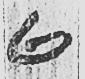㠯（以）
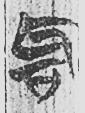{㠯ㅋ}
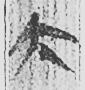大
